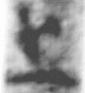之
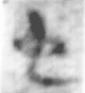屯
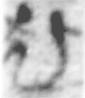狐
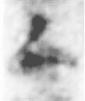白
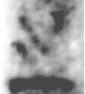之
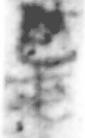聶（攝）
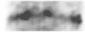一
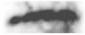一
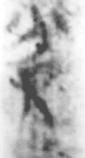貧（紛）
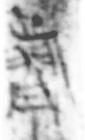旃
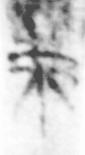朱
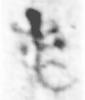毛
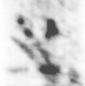之
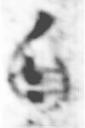首
